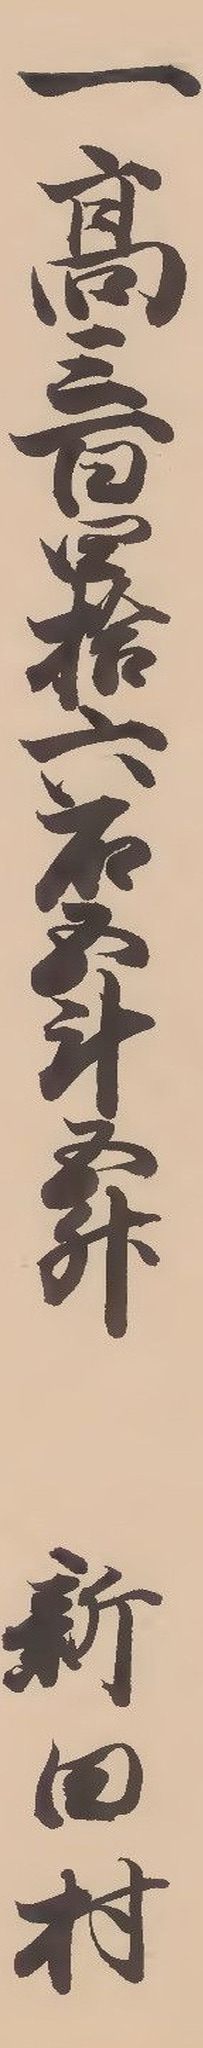一高三百四拾六石五斗五升新田村
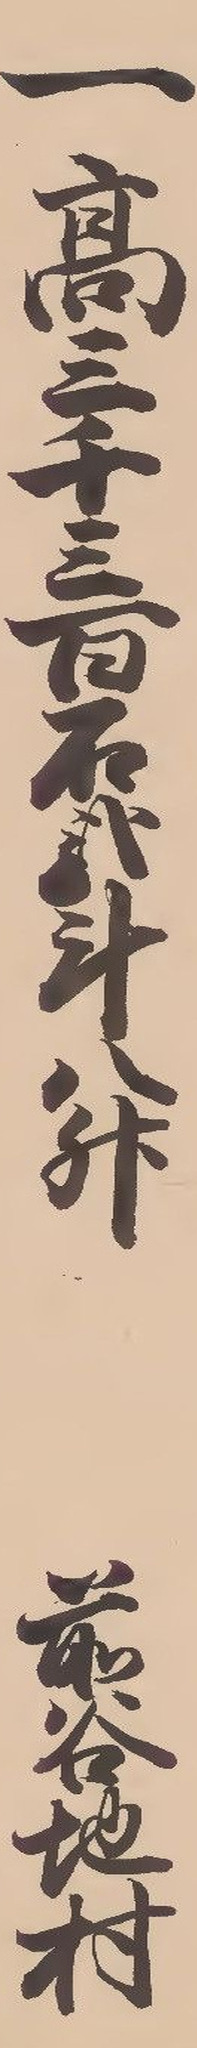一高三千三百石弐斗八升前谷地村
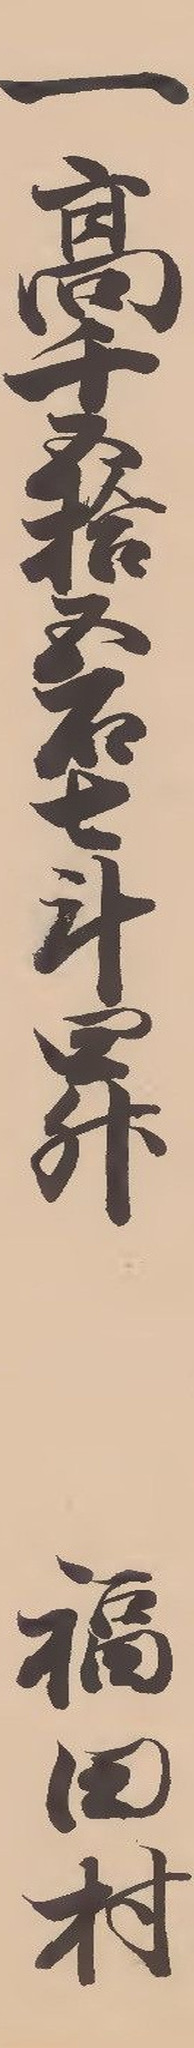一高千五拾五石七斗四升福田村
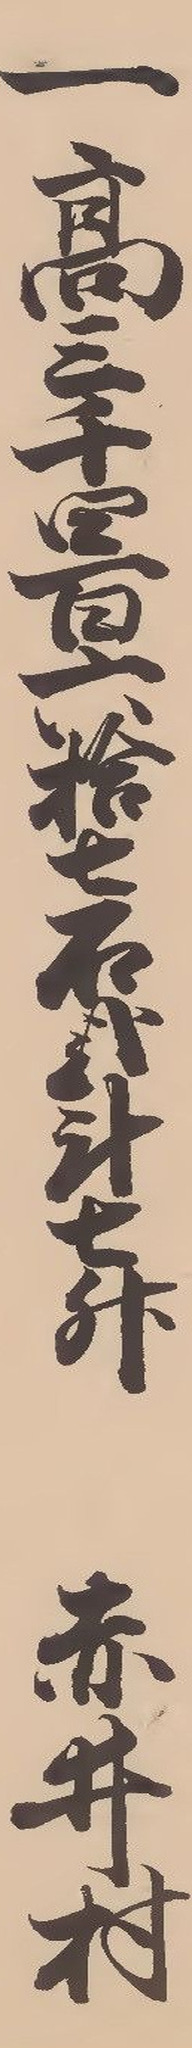一高三千四百六拾七石弐斗七升赤井村
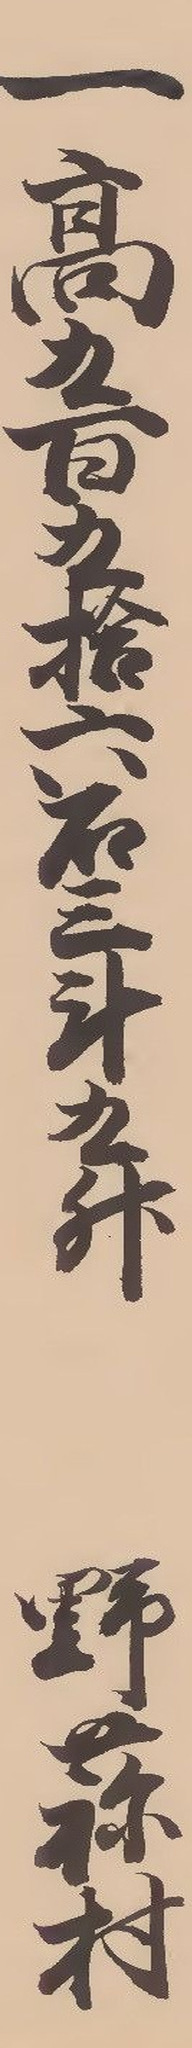一高九百九拾六石三斗九升野蒜村
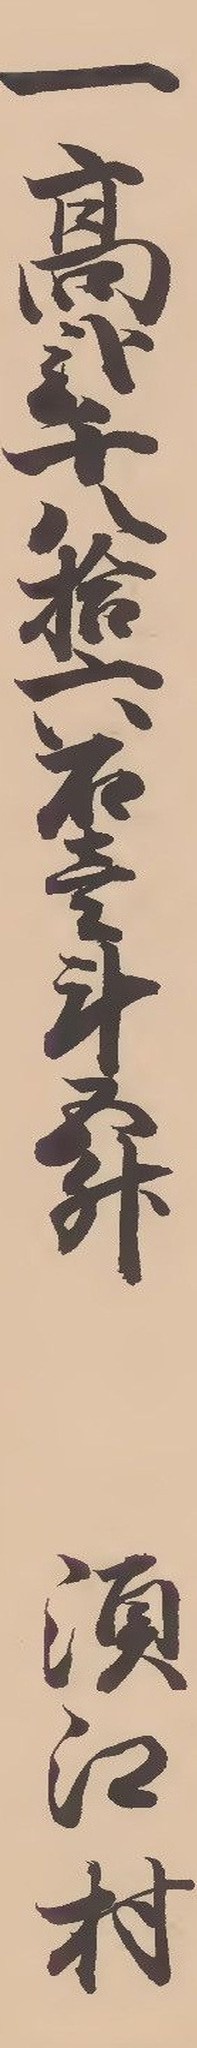一高弐千八拾六石壱斗五升須江村

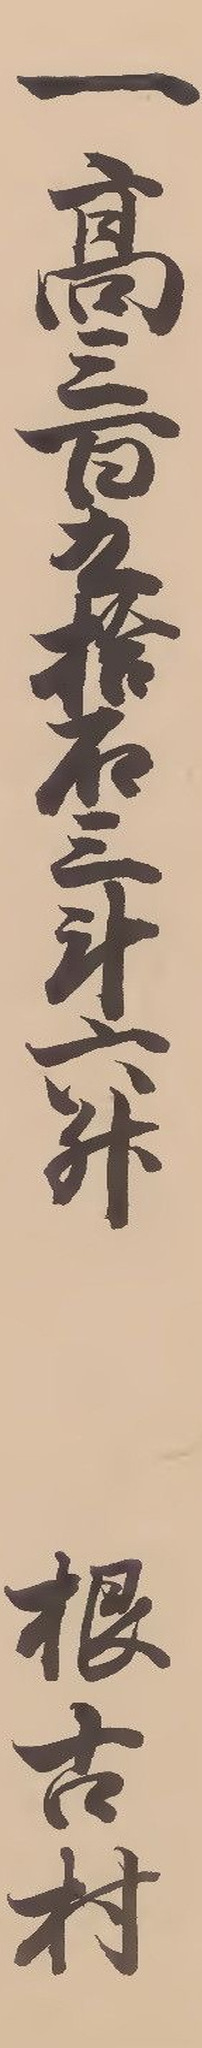一高三百九拾石三斗六升根古村
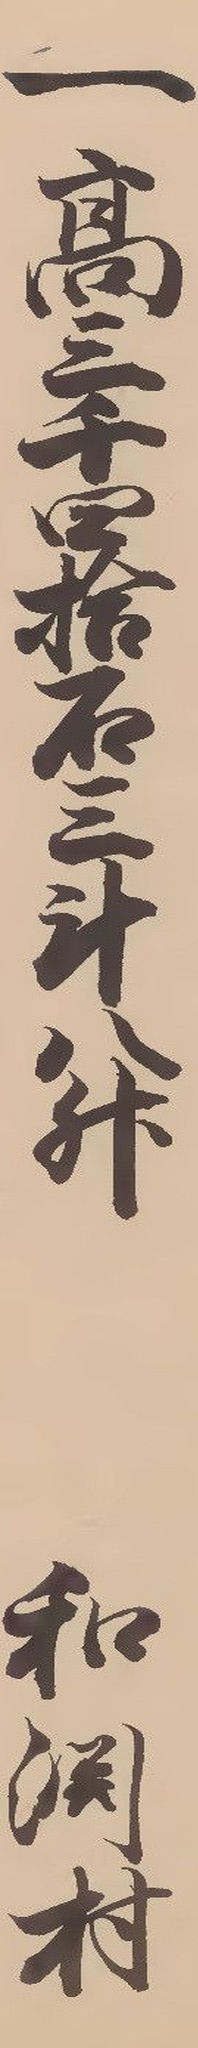一高三千四拾石三斗八升和淵村
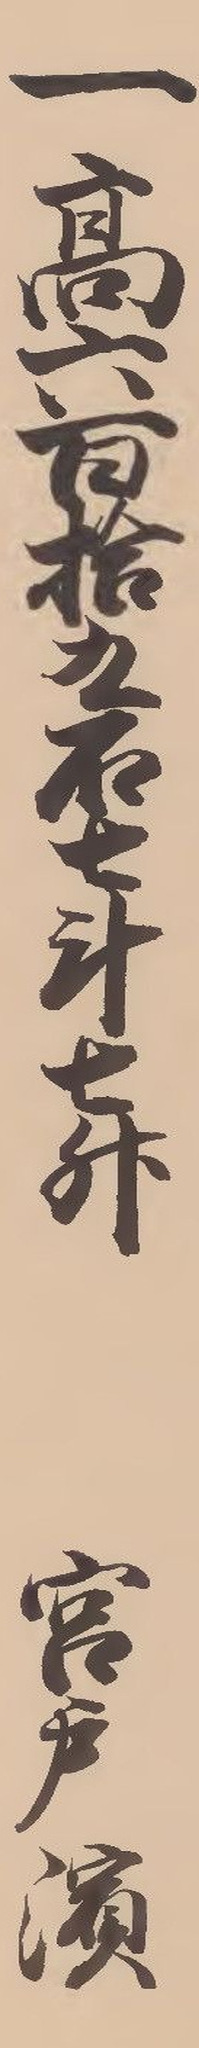一高六百拾九石七斗七升宮戸浜
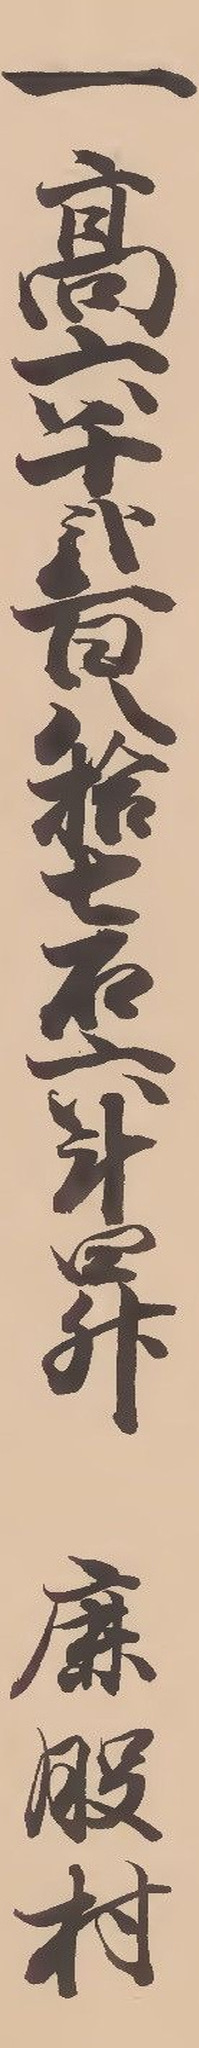一高六千弐百八拾七石六斗四升鹿股村
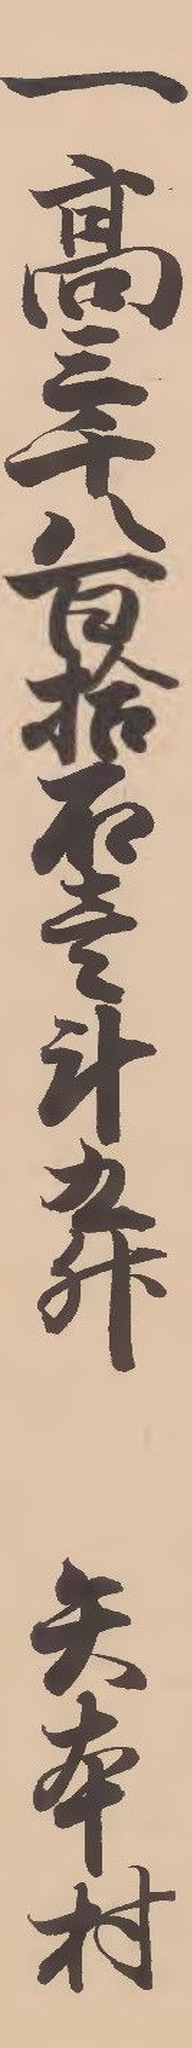一高三千八百拾石壱斗九升矢本村
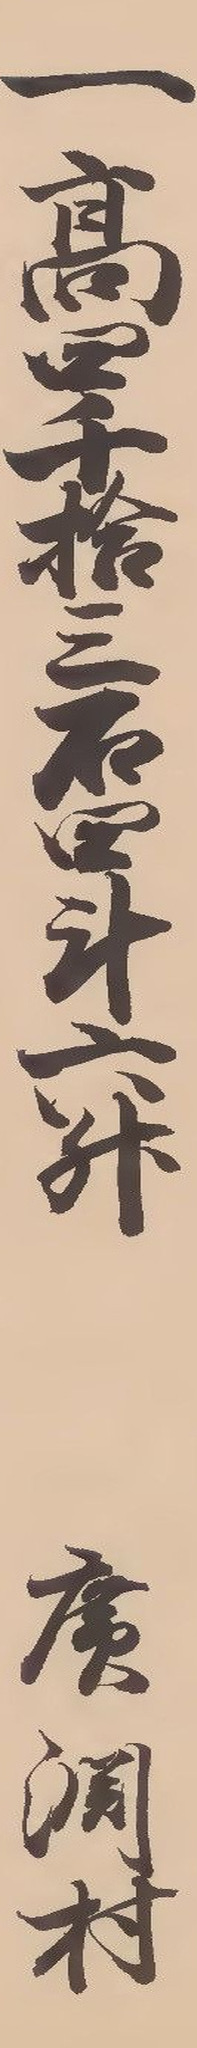一高四千拾三石四斗六升広淵村
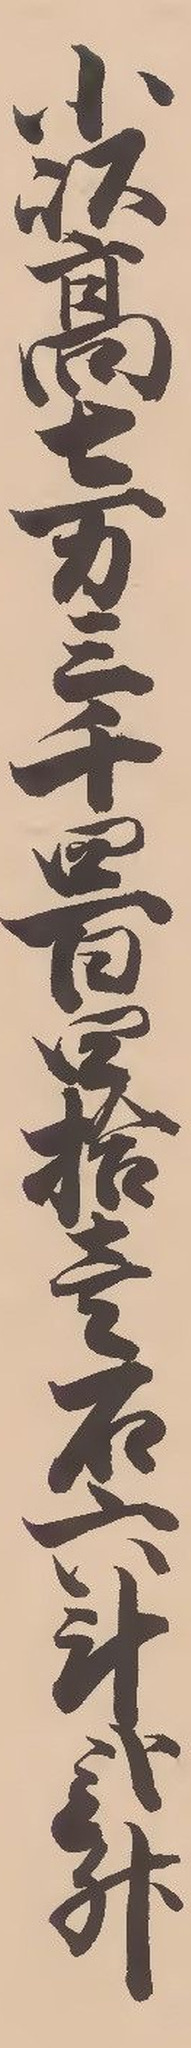小以高七万三千四百四拾壱石六斗弐升

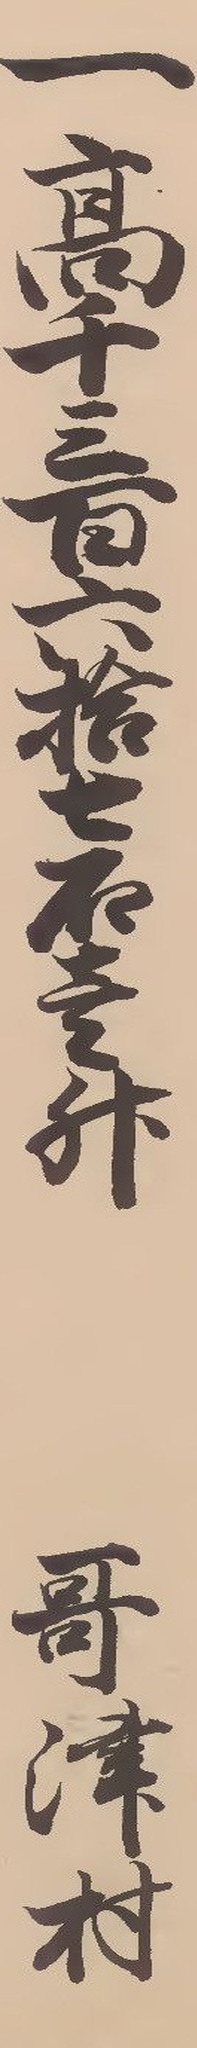一高千三百六拾七石壱升歌津村
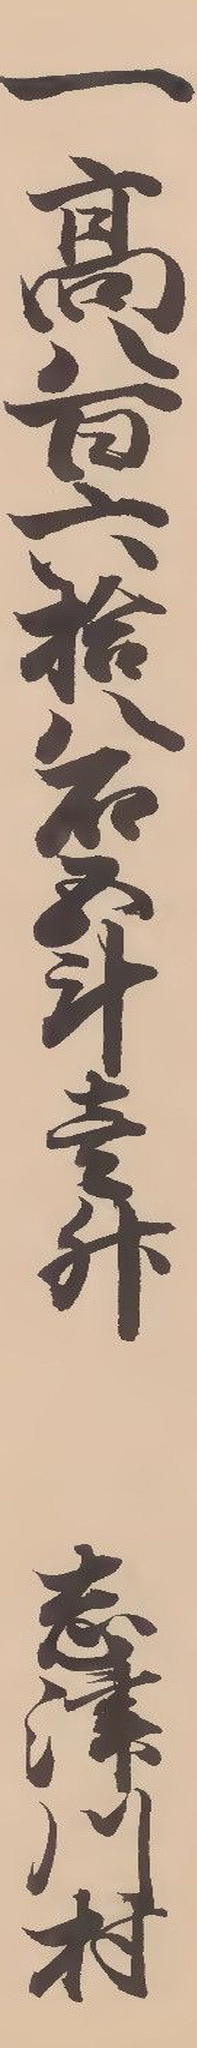一高八百六拾八石五斗壱升志津川村
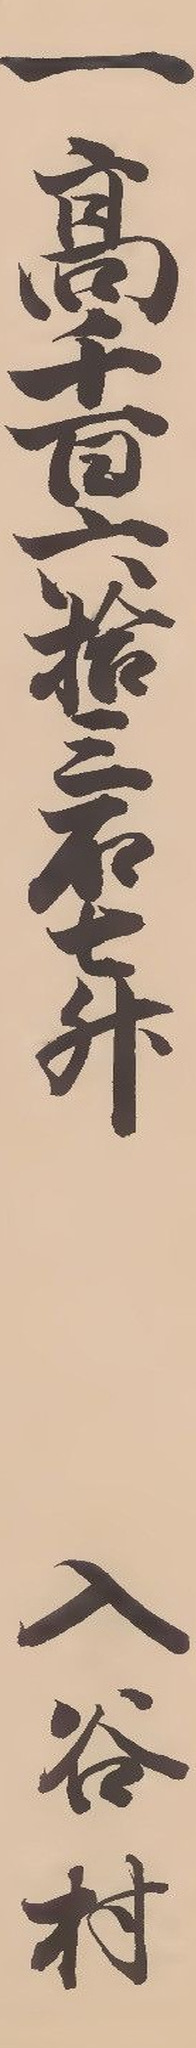一高千百六拾三石七升入谷村
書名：陸奥国郷帳　５
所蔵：国立公文書館 National Archives of Japan
